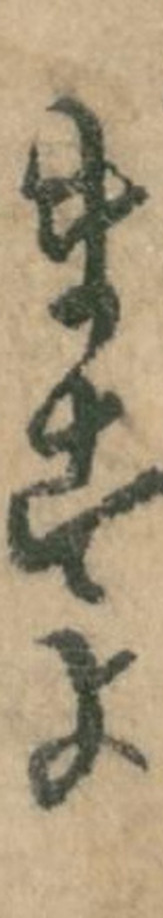ますよ
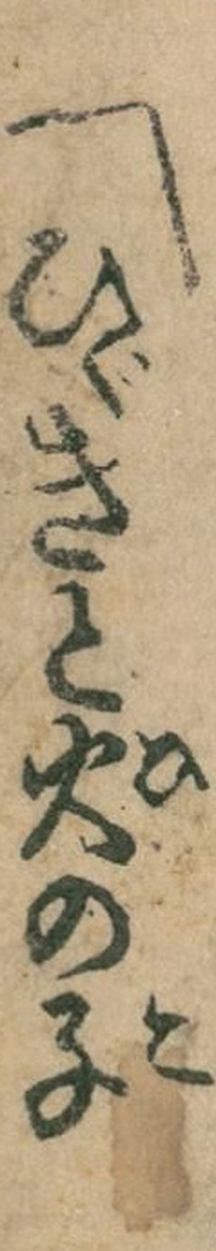〽ひゞきと火の子
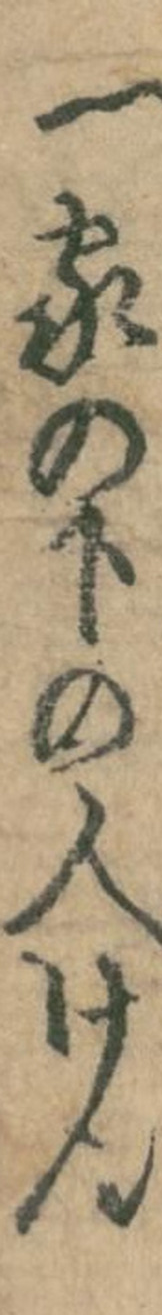〽家の下の人けん
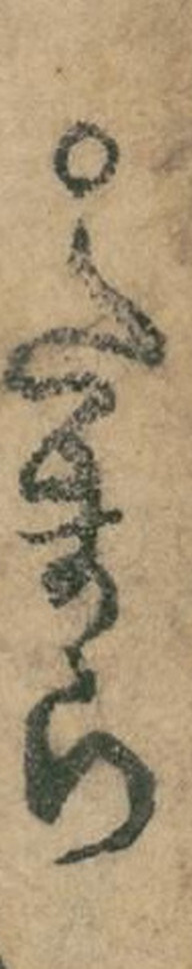◯たまら
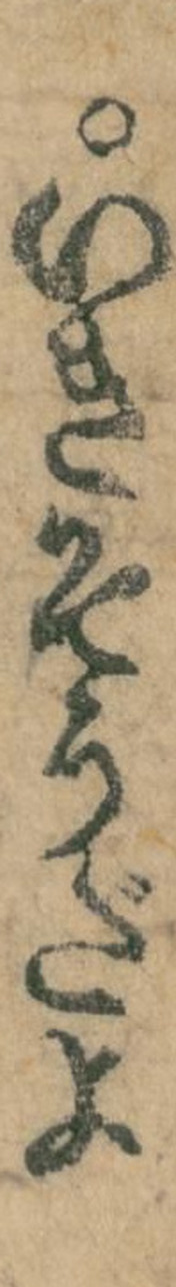◯いきそうだよ
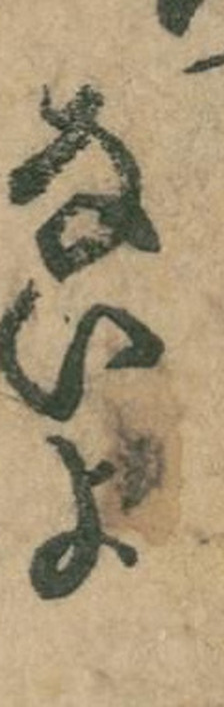ないよ
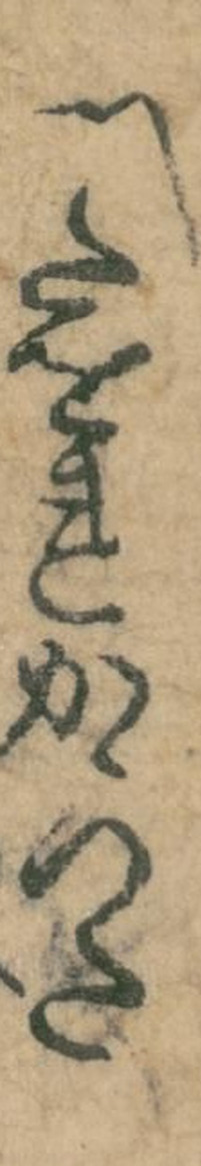〽たをれかゝつた
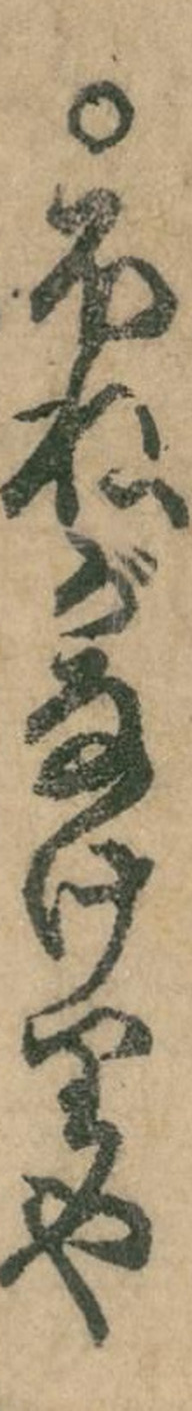◯ほねがなけりや
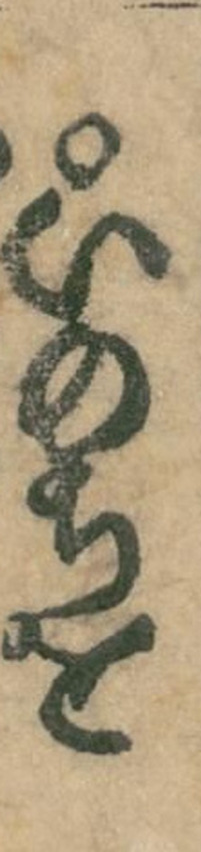◯いのちを
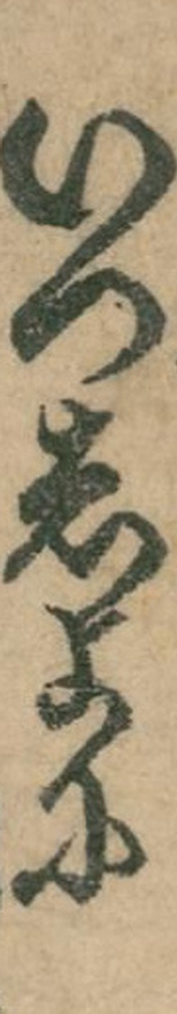いつしよに
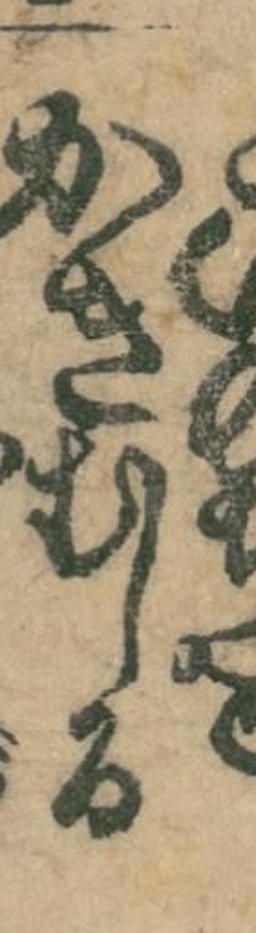かきむしる
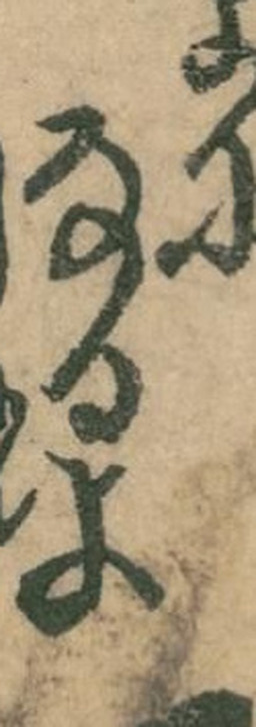なるよ
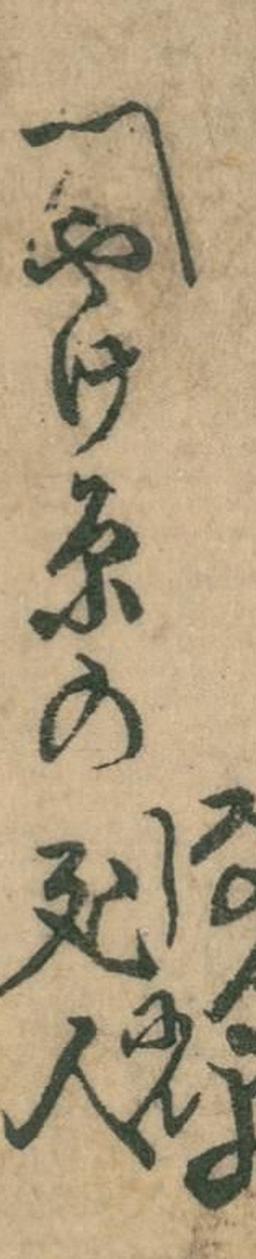〽やけ原の死人
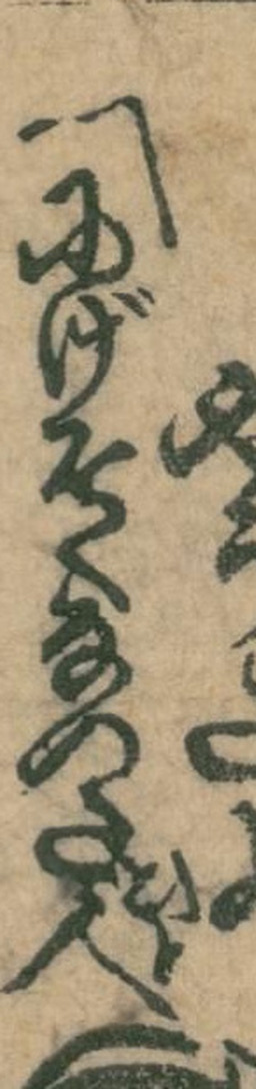〽にげそくなつた人
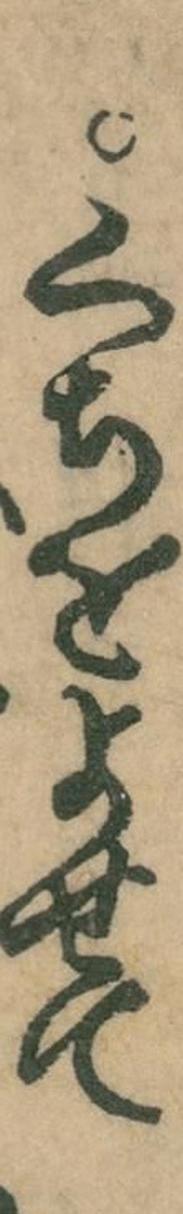◯くちをよせて
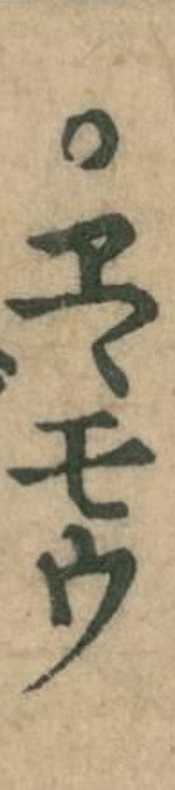◯エヽモウ
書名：地震出火　再度目のお笑ひ
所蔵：東京大学地震研究所図書室 Earthquake Research Institute Library, The University of Tokyo, JAPAN
